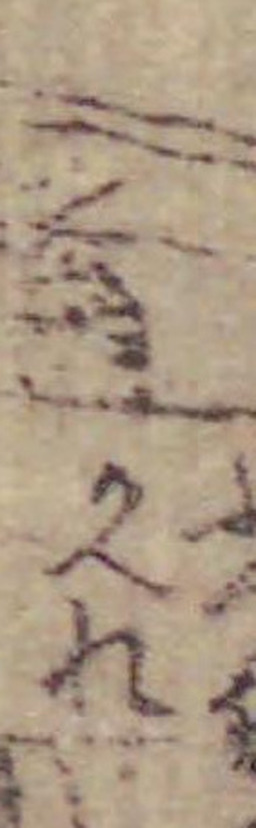かへれ
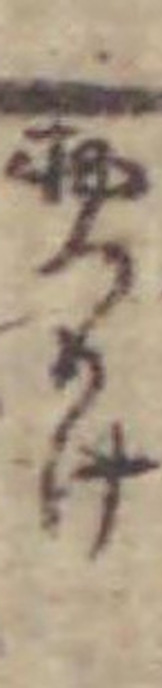おつかけ
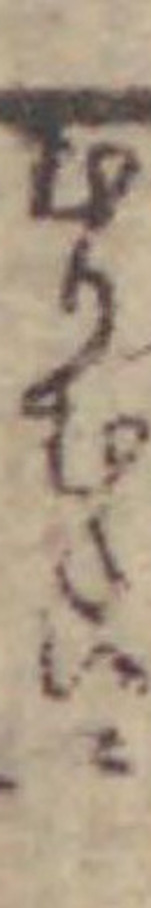むりむたいに
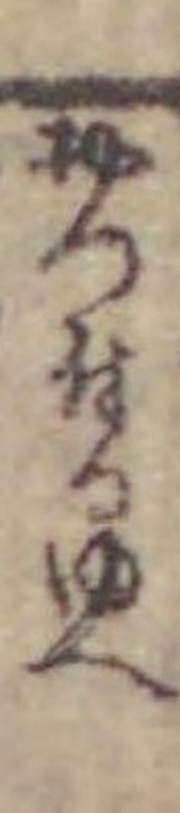おつ付るゆへ
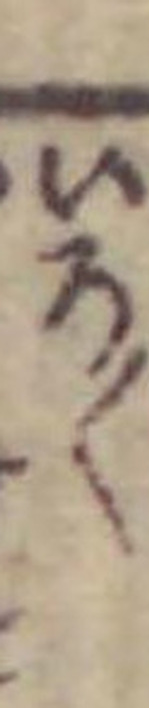いろ〳〵
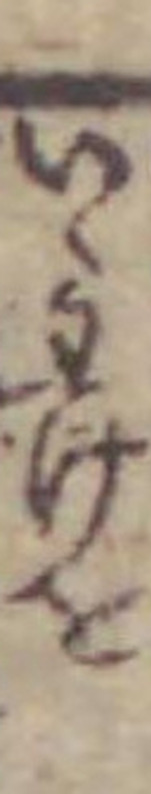いゝわけを
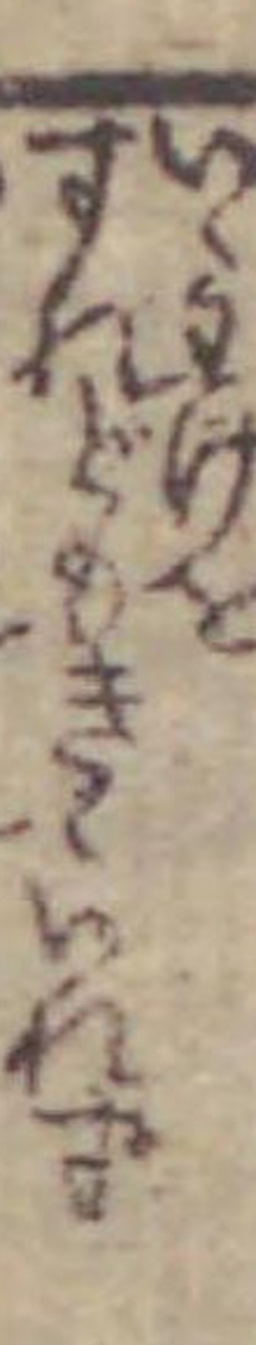すれどもきゝいれず
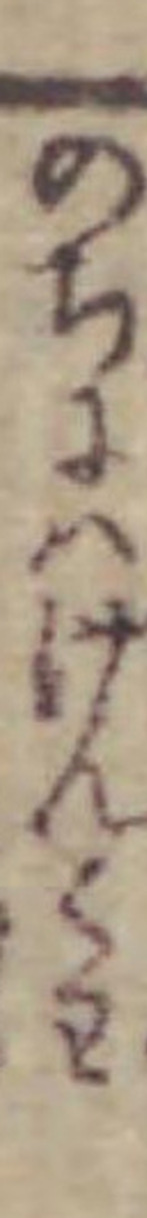のちにはけんくわ
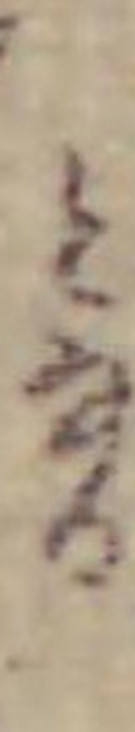となる
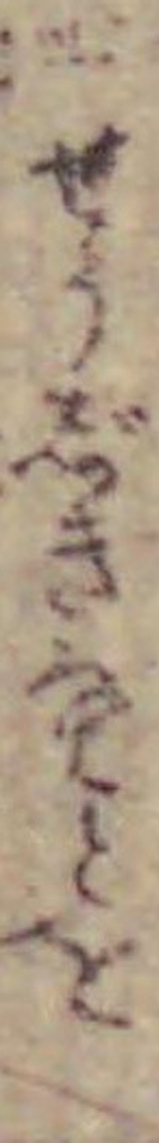せうじきなことを
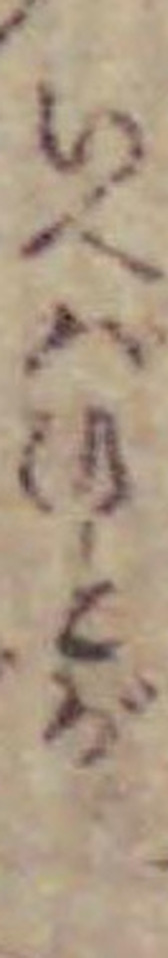いへばひとが
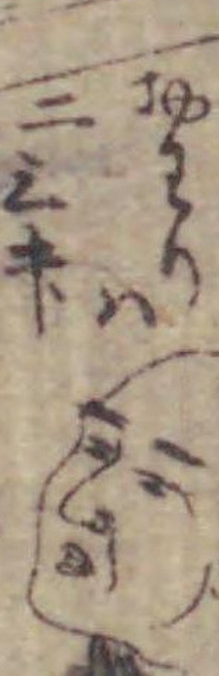二三升
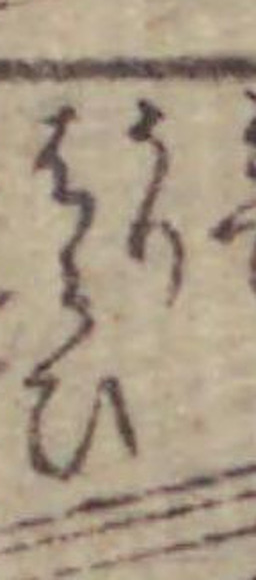はらひ
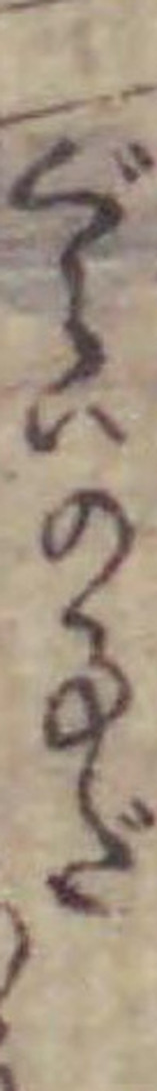ぐらいの事だ
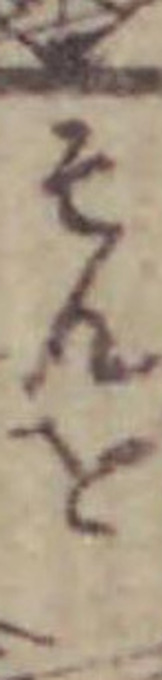そんを
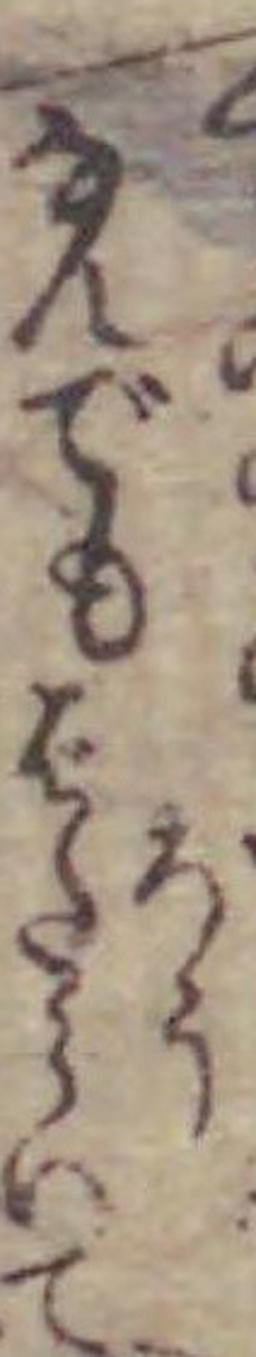なんでもはたらいて
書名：莫切自根金生木 : 3巻
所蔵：国立国会図書館 National Diet Library, JAPAN
